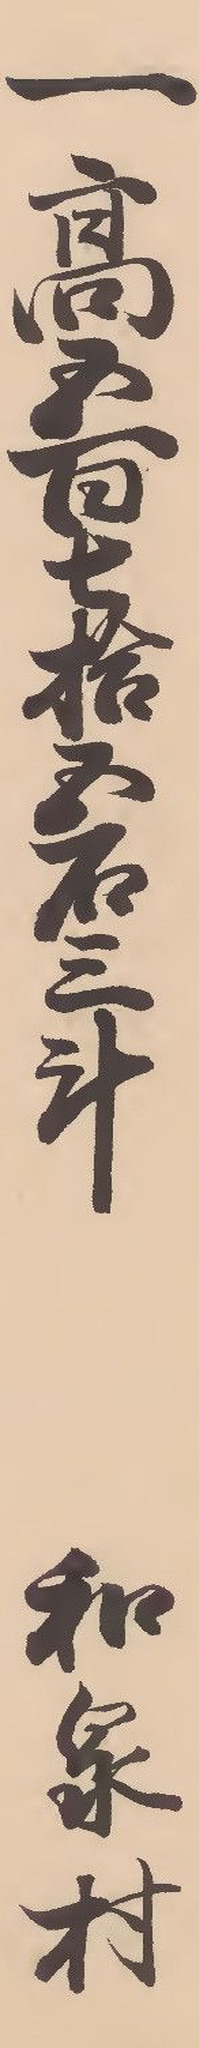一高五百七拾五石三斗和泉村
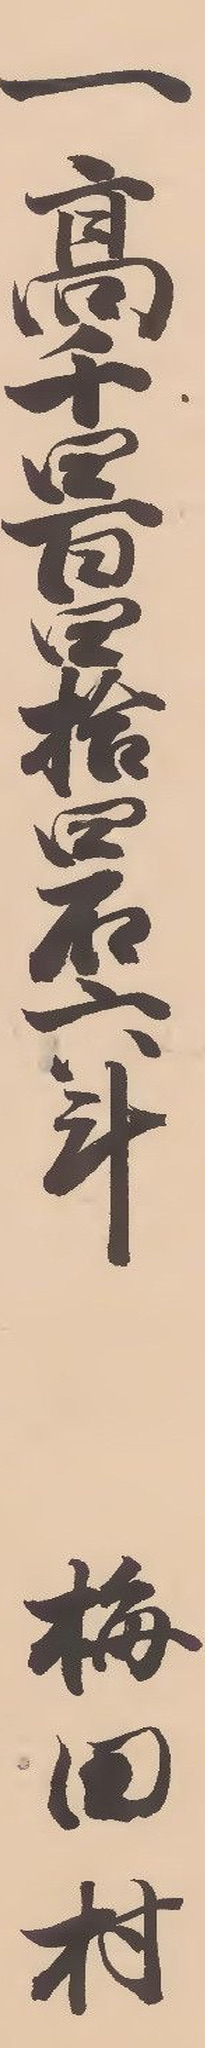一高千四百四拾四石六斗梅田村
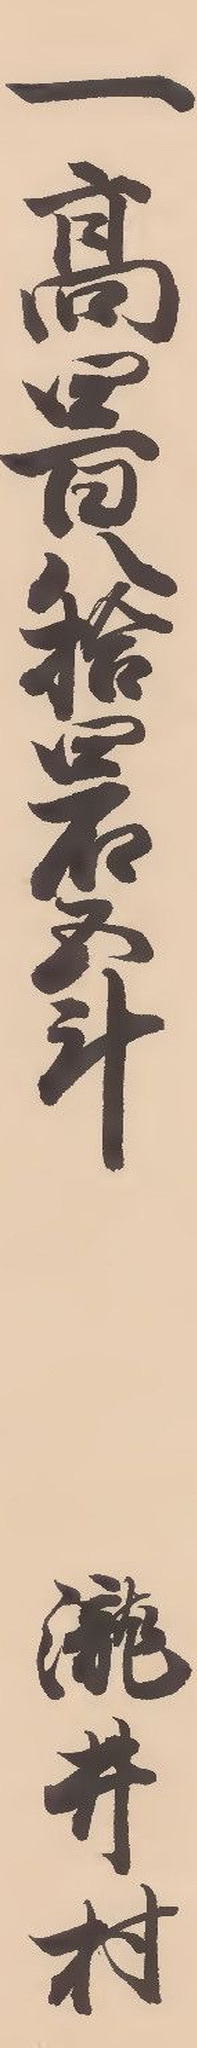一高四百八拾四石五斗滝井村
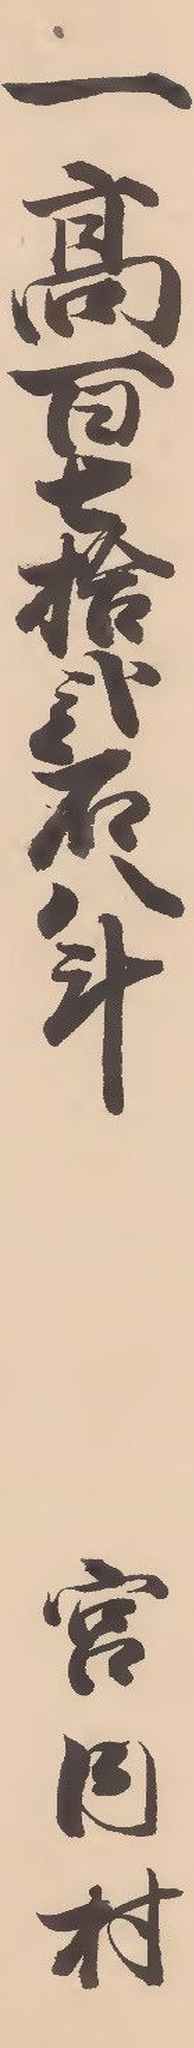一高百七拾弐石八斗宮内村
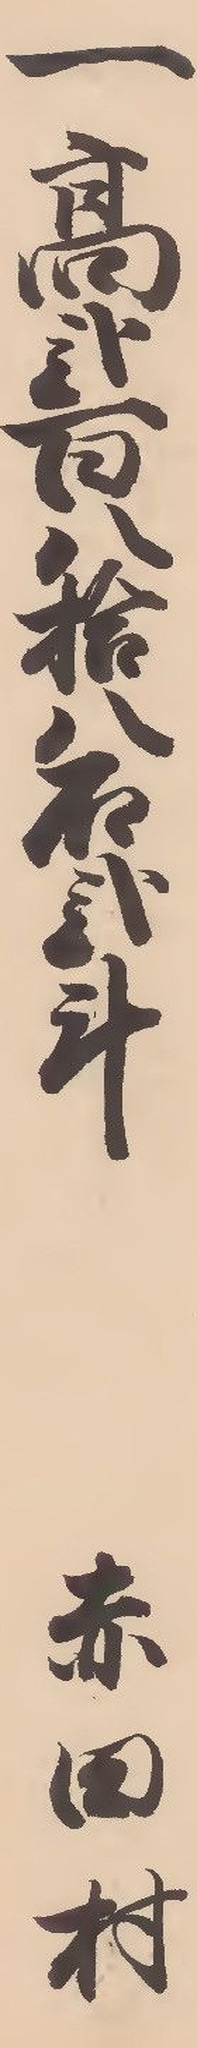一高弐百八拾八石弐斗赤田村

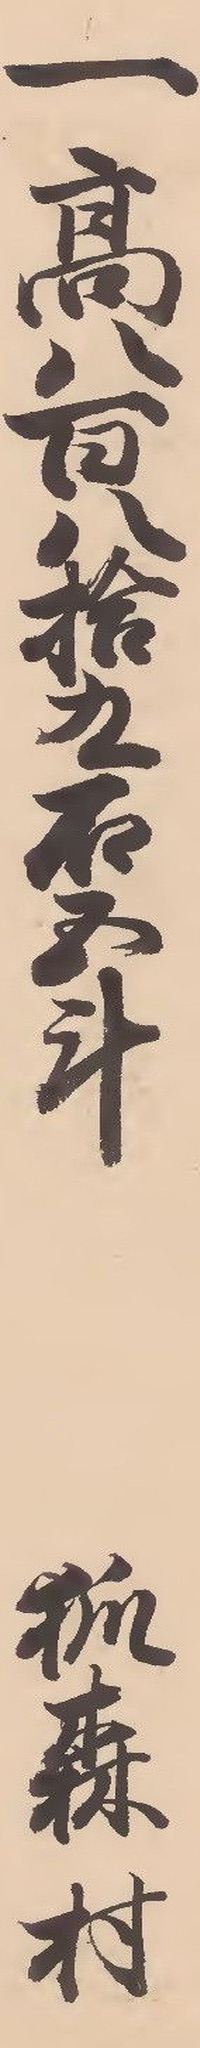一高八百八拾九石五斗狐森村
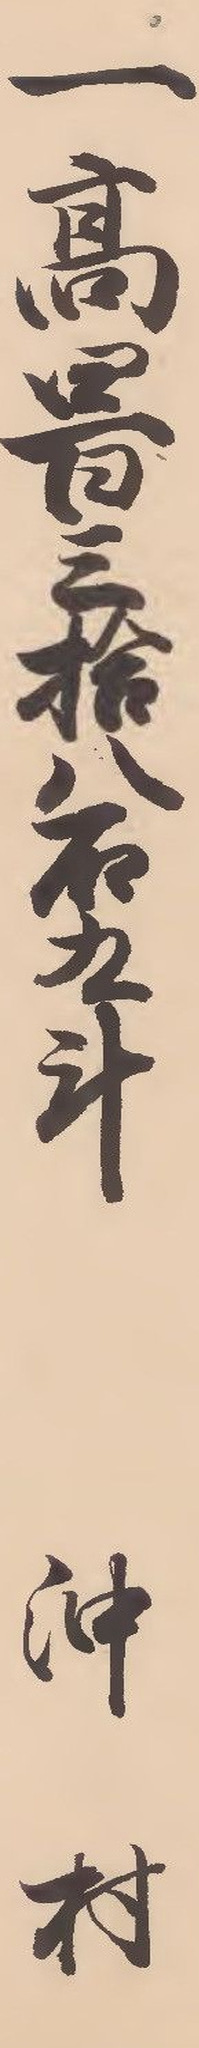一高四百三拾八石九斗沖村
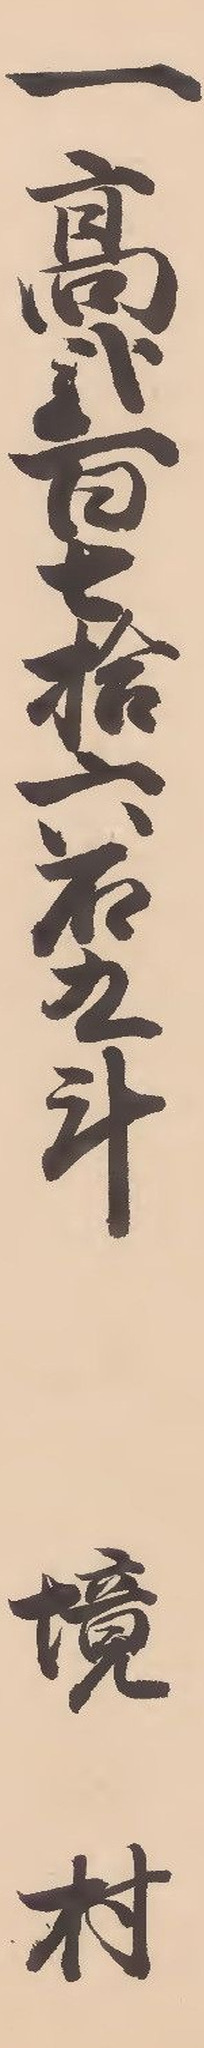一高弐百七拾六石九斗境村
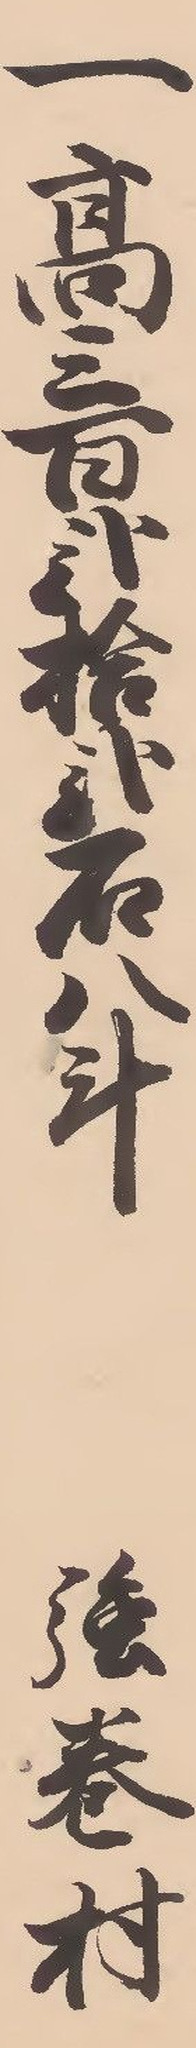一高三百弐拾弐石八斗強巻村
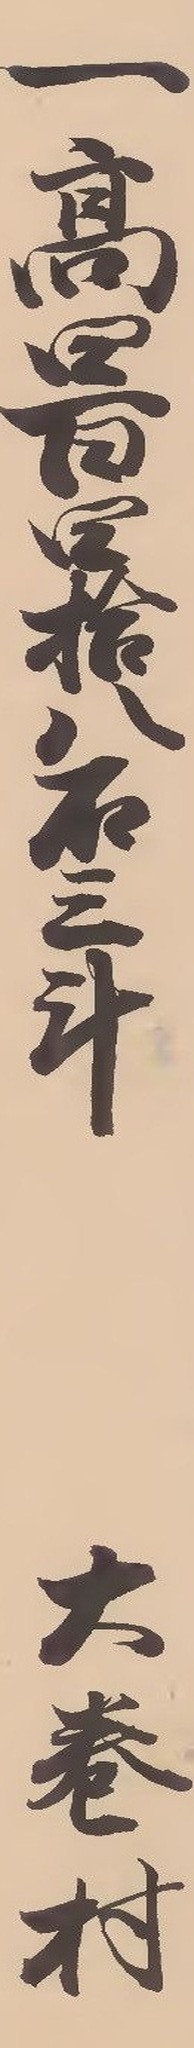一高四百四拾八石三斗大巻村
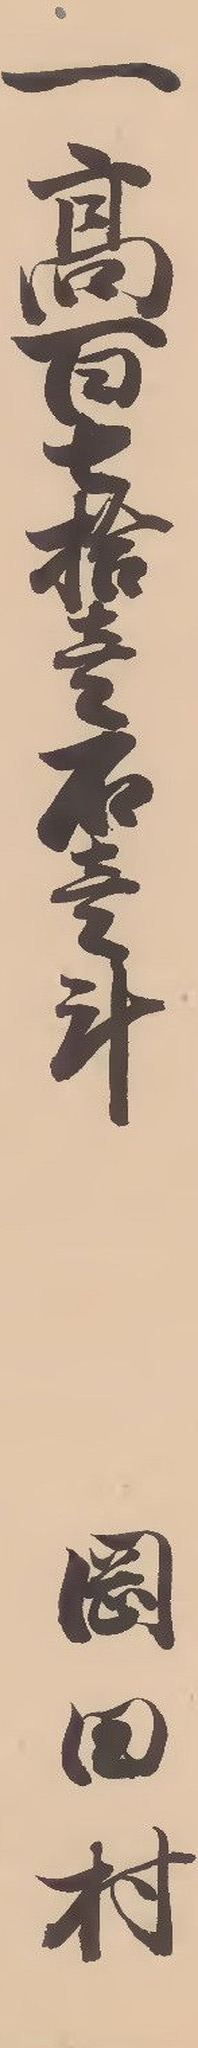一高百七拾壱石壱斗岡田村
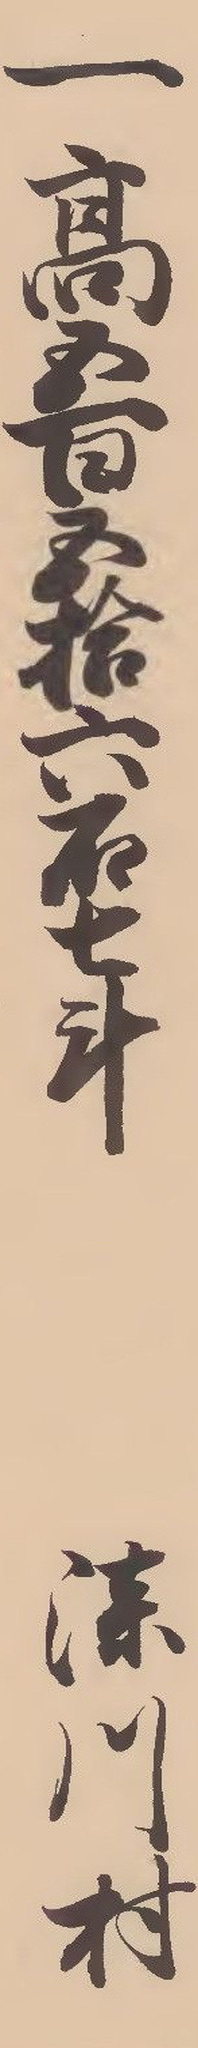一高五百五拾六石七斗漆川村

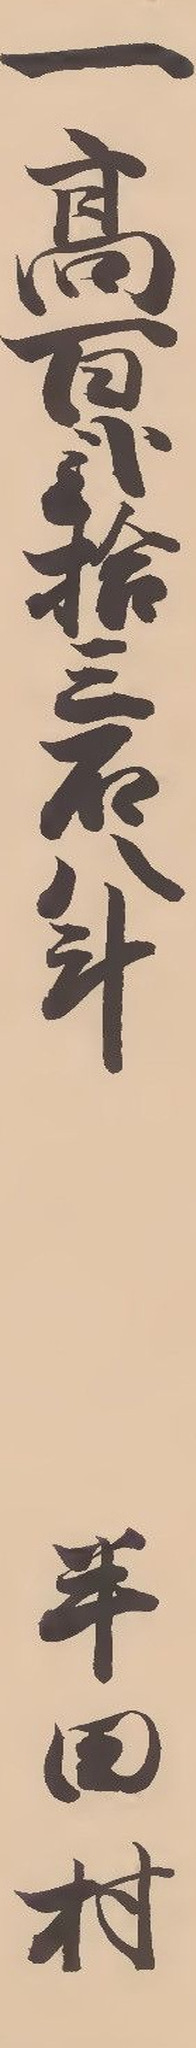一高百弐拾三石八斗半田村
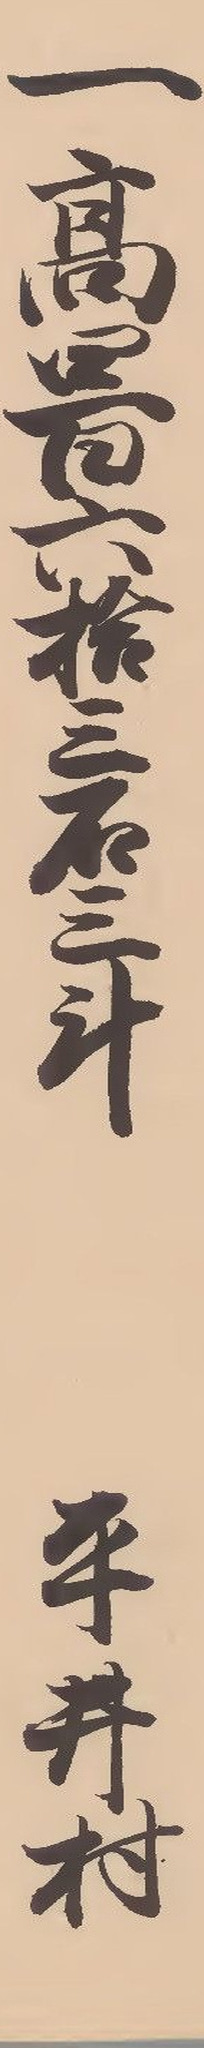一高四百六拾三石三斗平井村
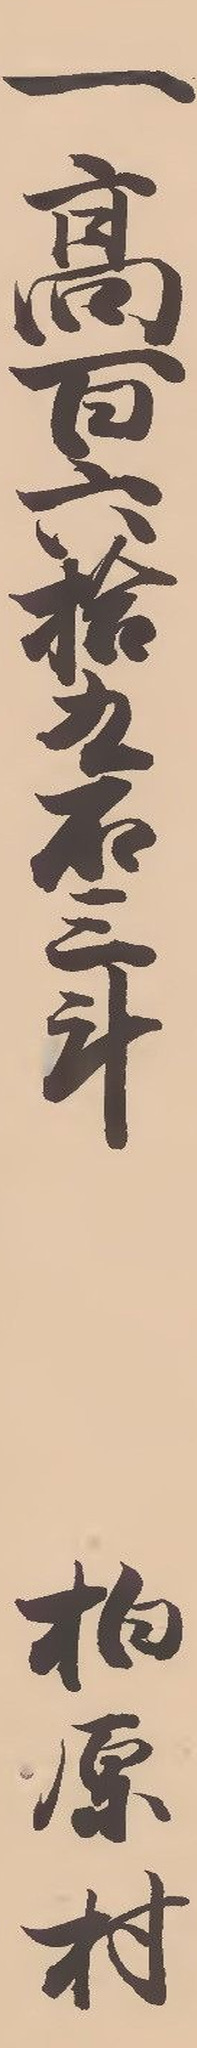一高百六拾九石三斗柏原村
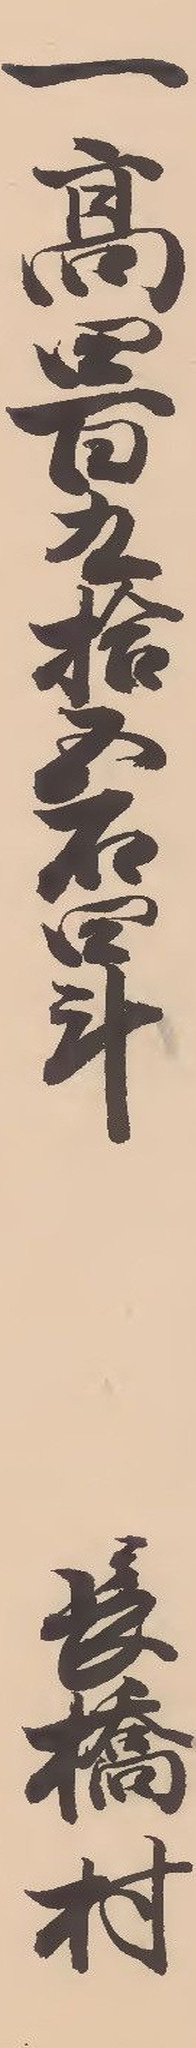一高四百九拾五石四斗長橋村
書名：陸奥国郷帳　７
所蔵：国立公文書館 National Archives of Japan
